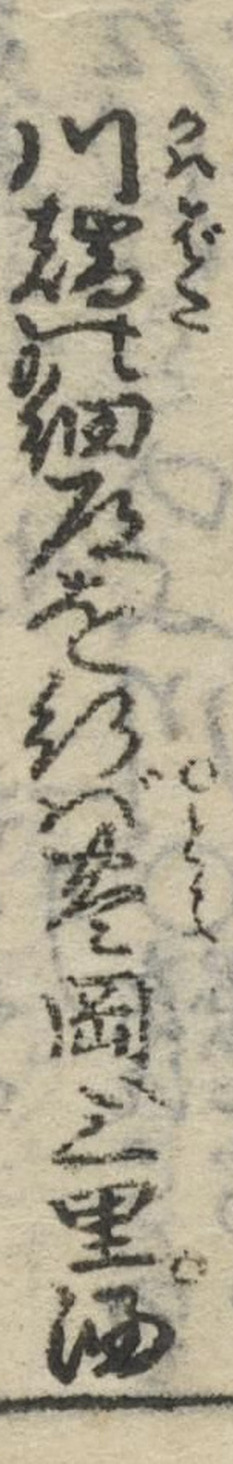川端の細屋を行ば豊岡へ三里。湯
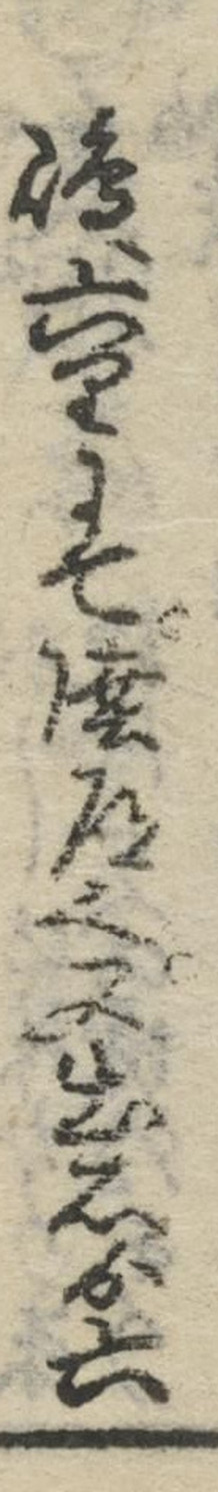嶋へ六里にて。陸道也。又出石ゟ六
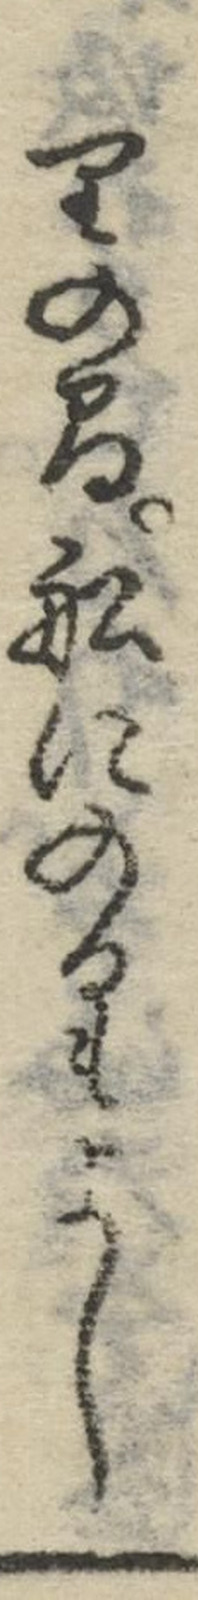里の間。舩にのるもよし
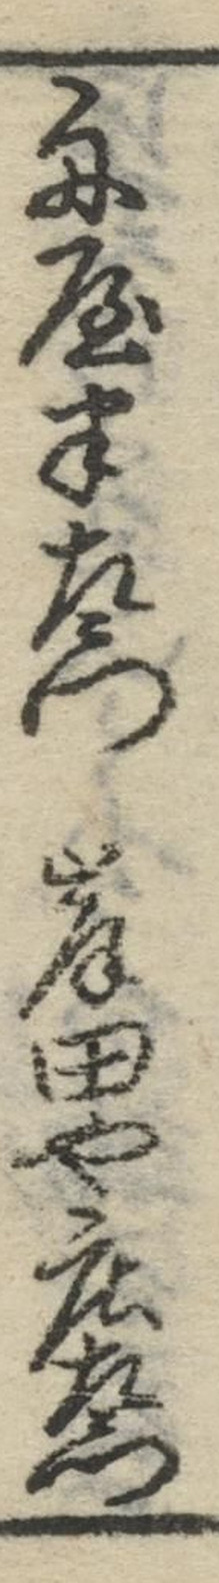舟屋半左衛門岸田や庄左衛門
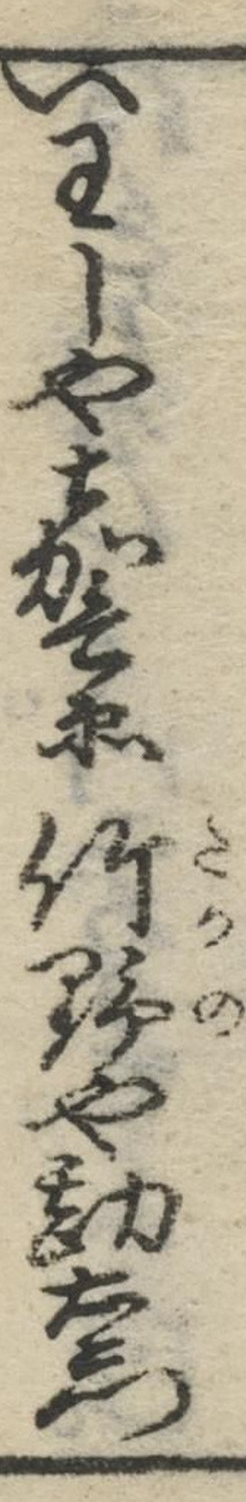いわしや嘉兵衛竹野や勘右衛門
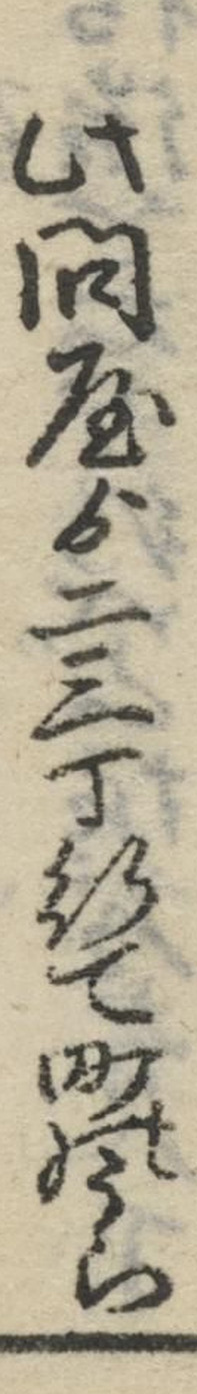此問屋ゟ二三丁行て町のうら
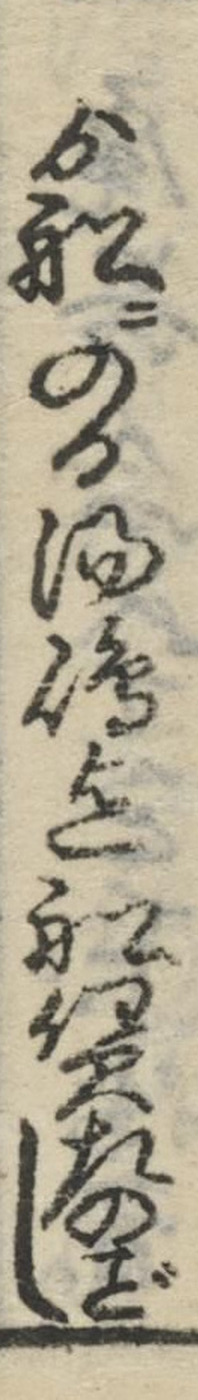ゟ舩にのり湯嶋迄舩賃左のごとし
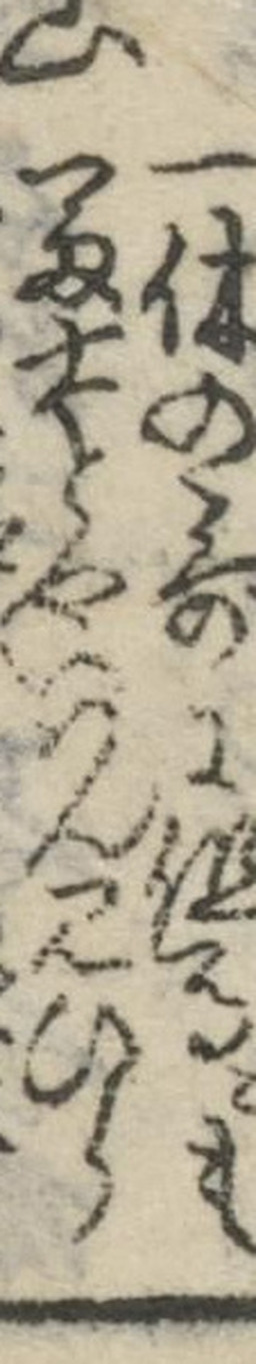富士とやいはん見ひら
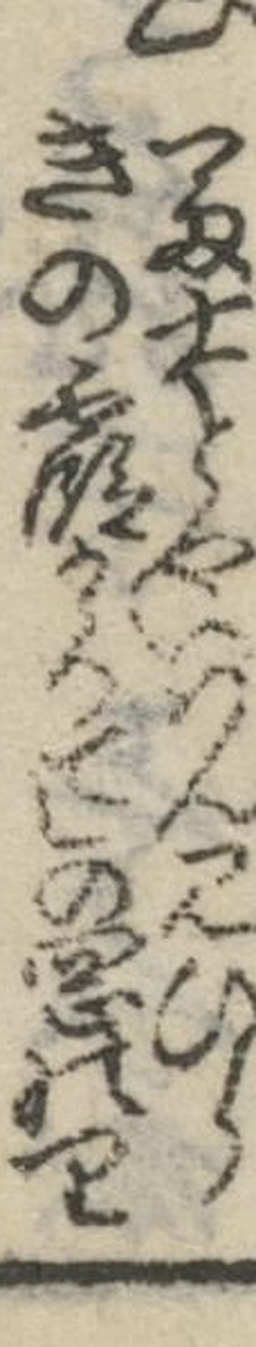きの霞かゝりてしの岡の里
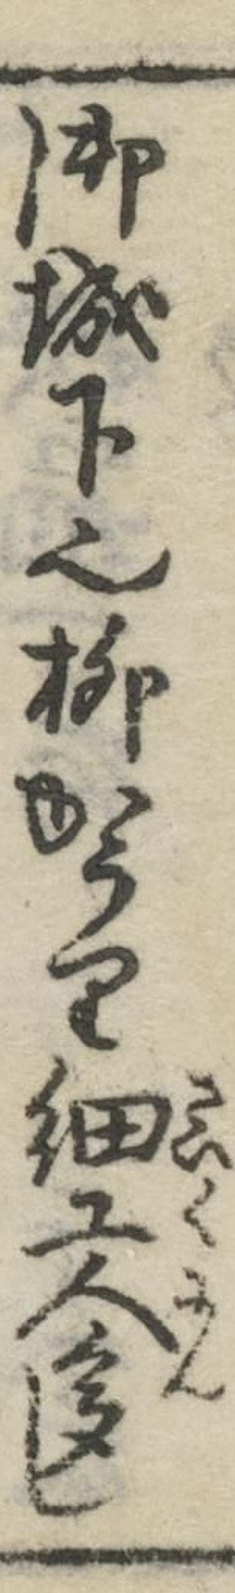御城下也柳かうり細工人多し
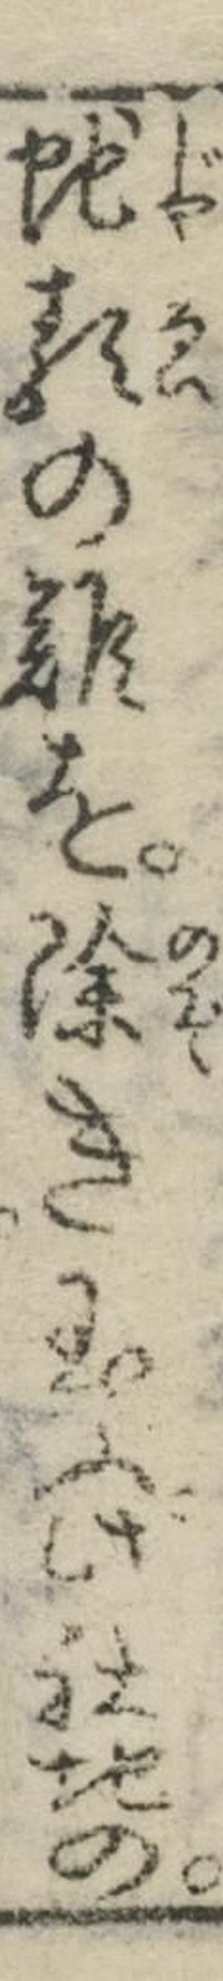蛇類の難を。除き玉ふ此社地の。
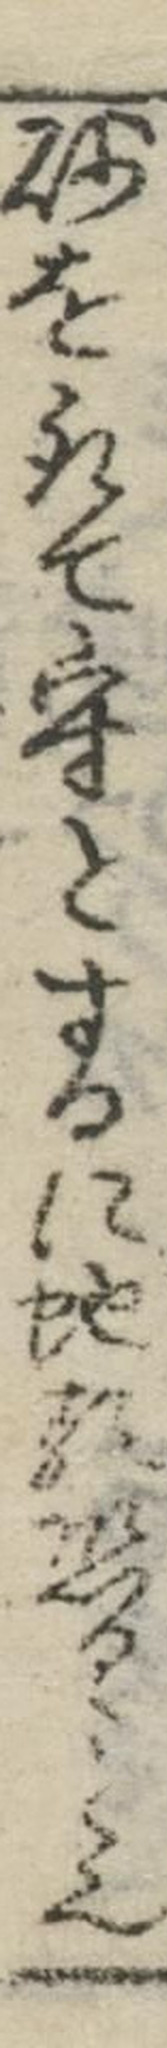砂を取て守とするに。地類恐りゝら也

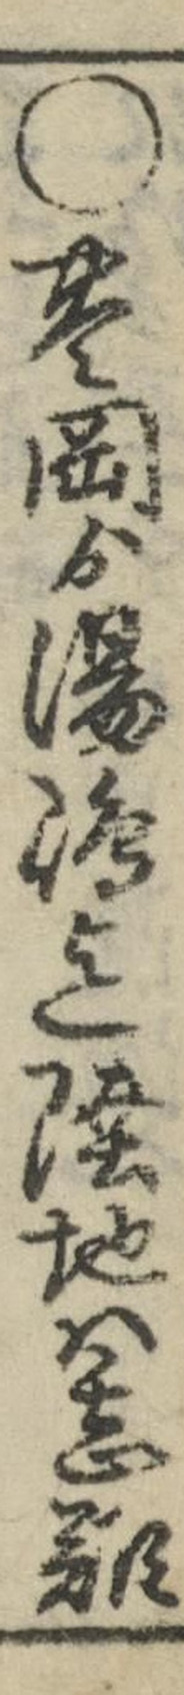○豊岡ゟ湯嶋迄陸地は甚難
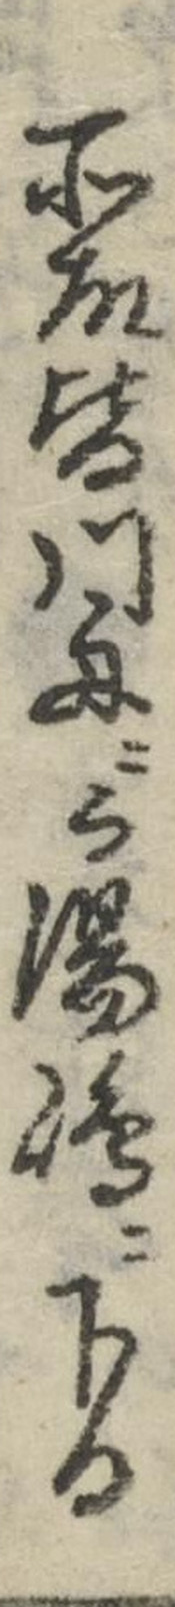所候皆川舟にて湯嶋に下る
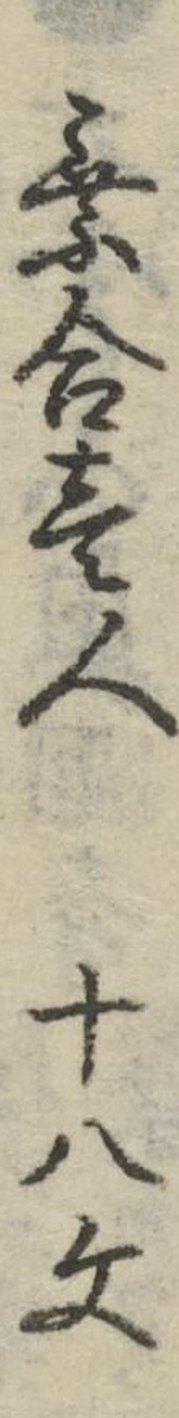乗合壱人十八文
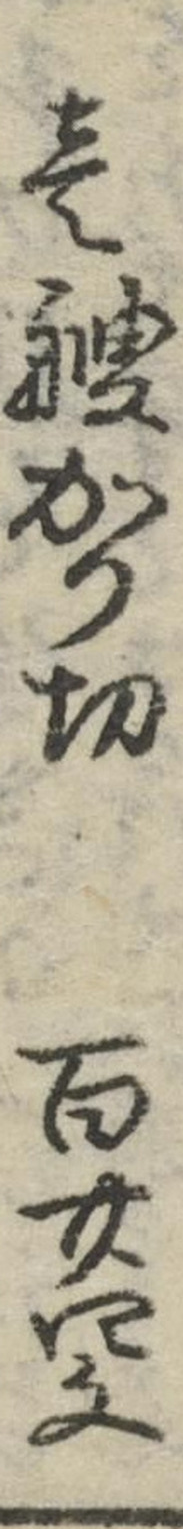壱艘かり切百廿四文
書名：但州城崎浴湯辧
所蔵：東京大学地震研究所図書室 Earthquake Research Institute Library, The University of Tokyo, JAPAN
